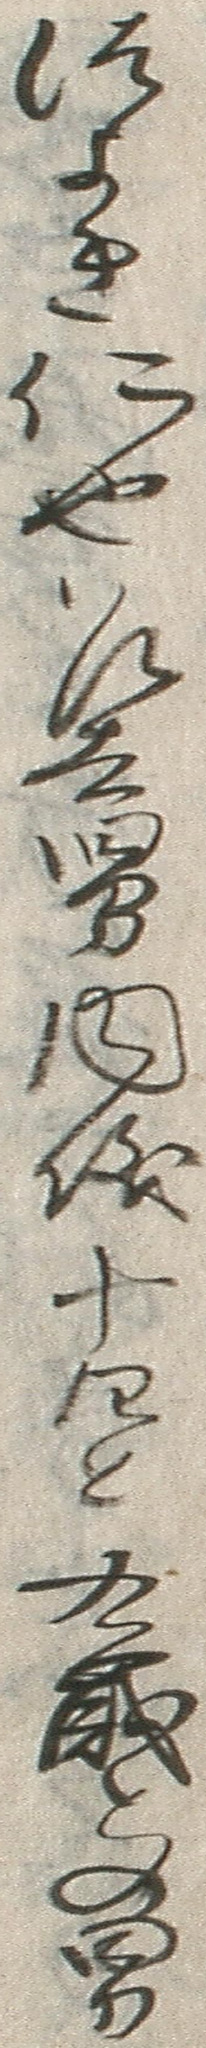つよき仁也乍去舅内儀十四と九歳との男
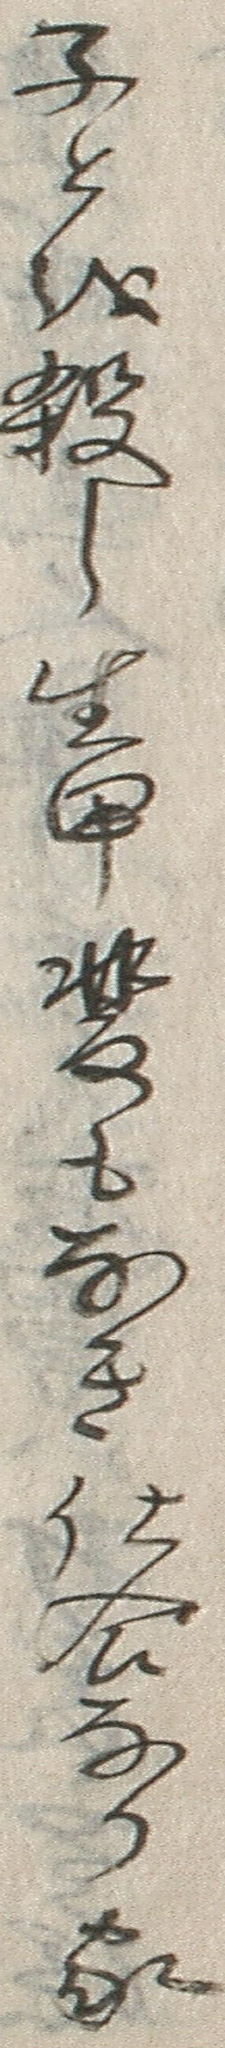子とを殺し生甲斐もなき仕合なり家
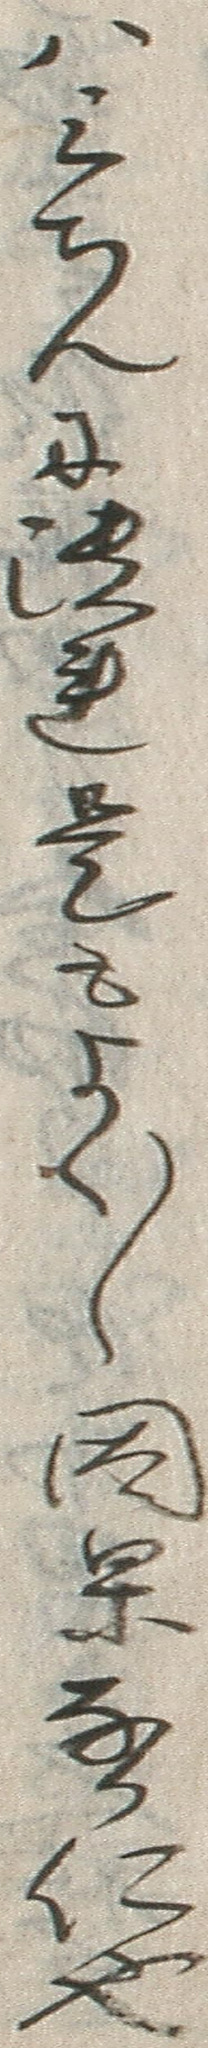はみちんに潰れ是もよく〳〵因果なる仁也
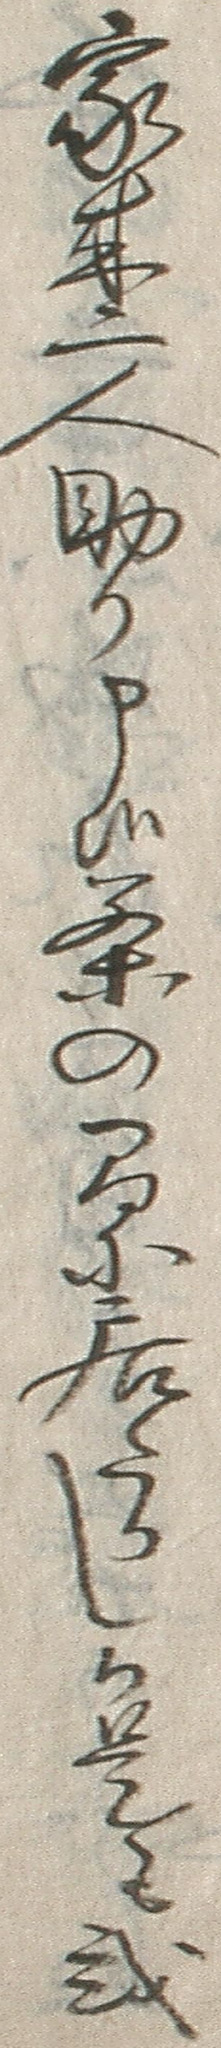家来二人助り申候茶の間に居たりしか是も弐

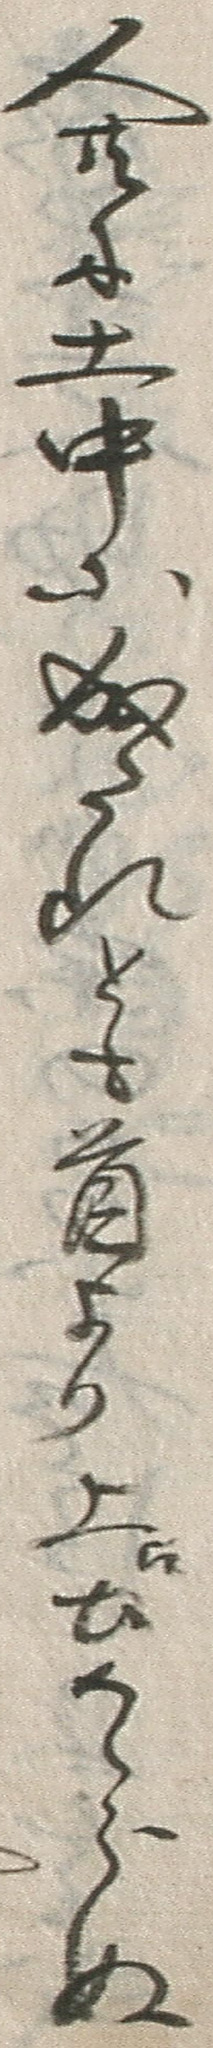人共に土中に成たれとも首より上え土かゝらぬ
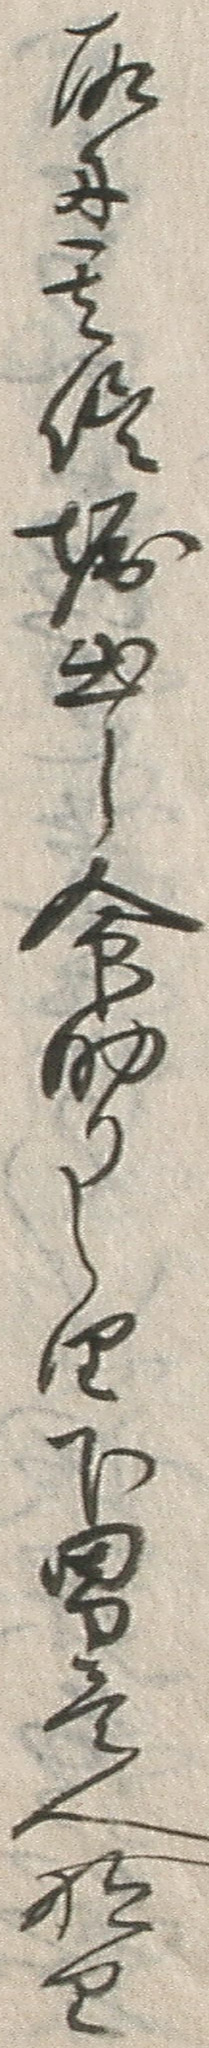故に其侭堀出し命助りし由下男壱人なり
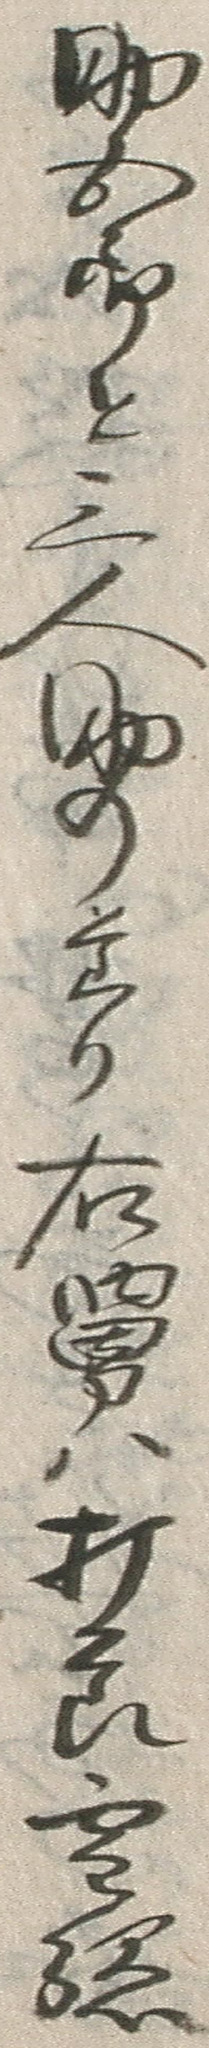助五郎と三人助りたり右舅は折節雪隠
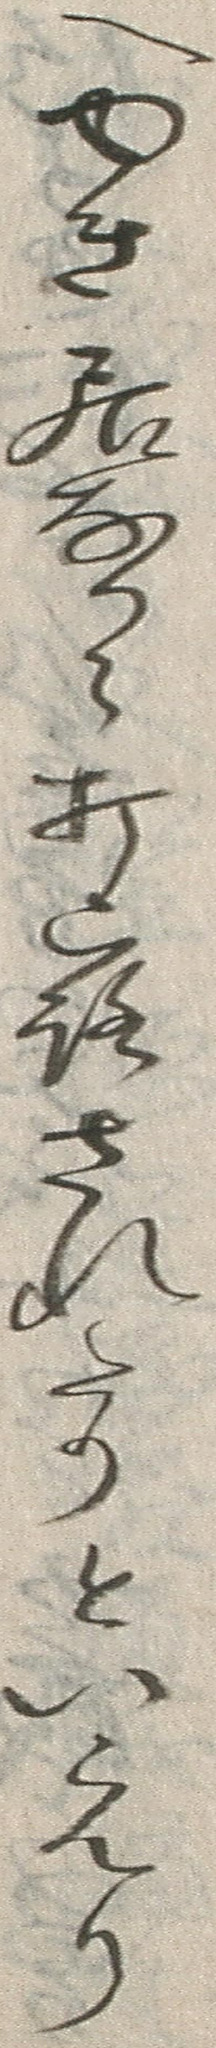へゆき居なから打ころされたりといえり
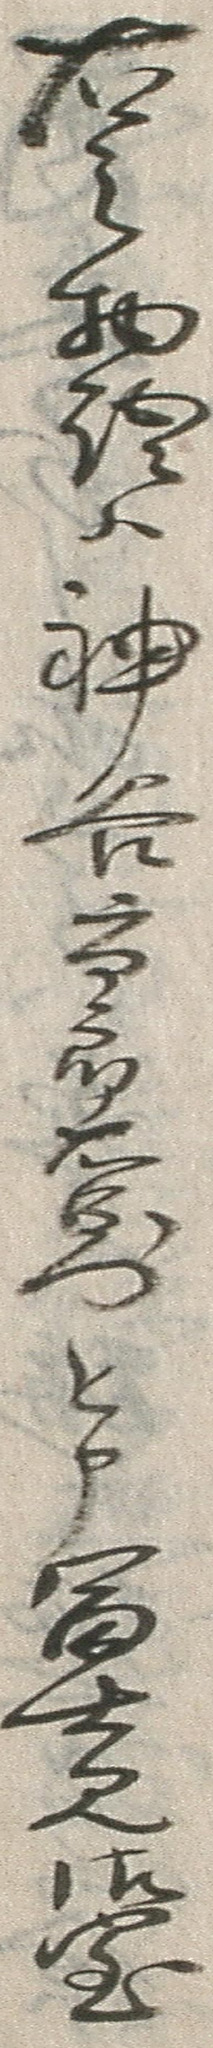右之物語は神谷市郎右衛門と申富士見御宝
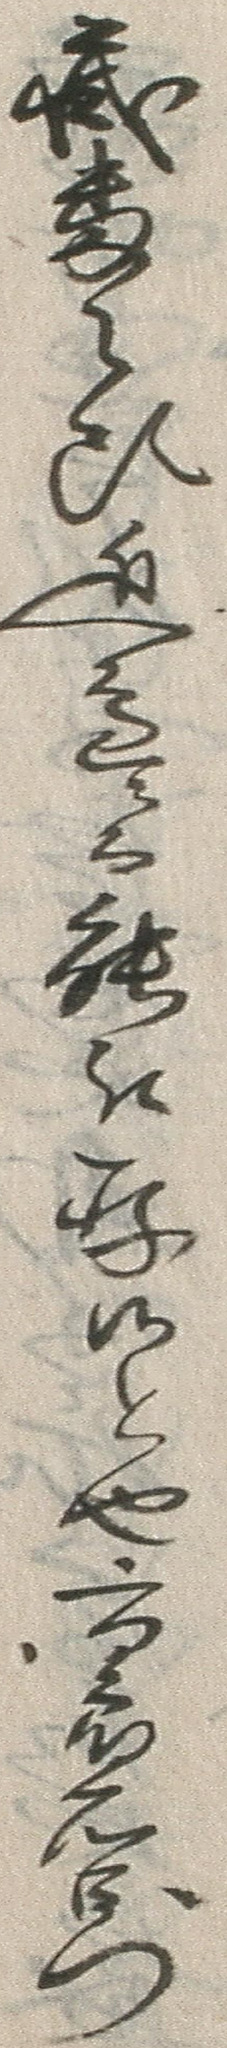蔵番之頭近辺にて能被存候とや市郎右衛門
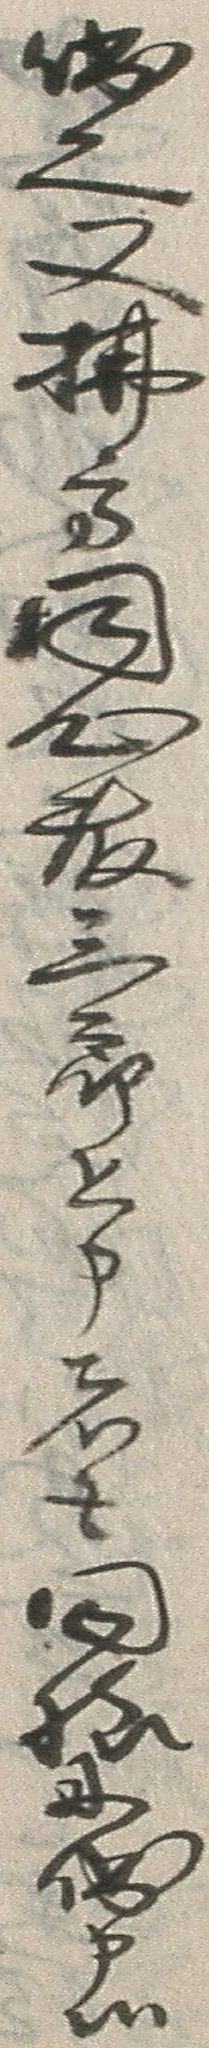咄也又払方同心藤三郎と申者も同様に咄申候
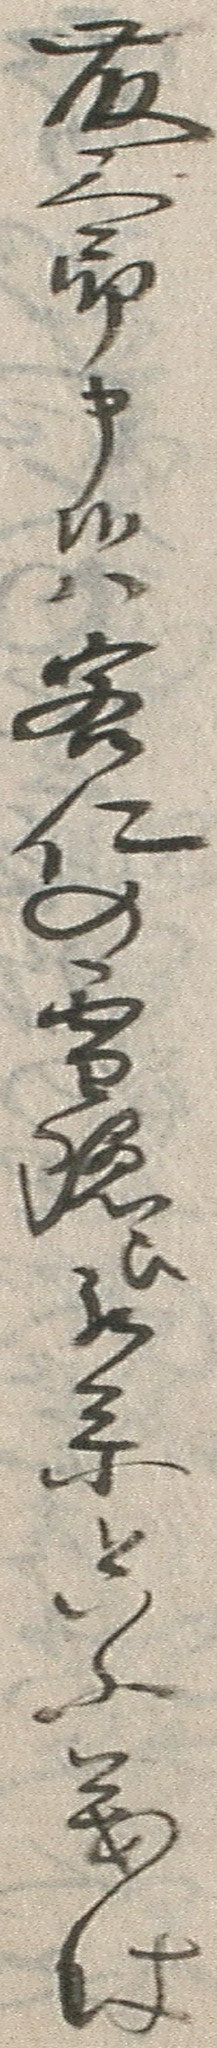藤三郎申候は客仁の雪隠え被参といふ義は
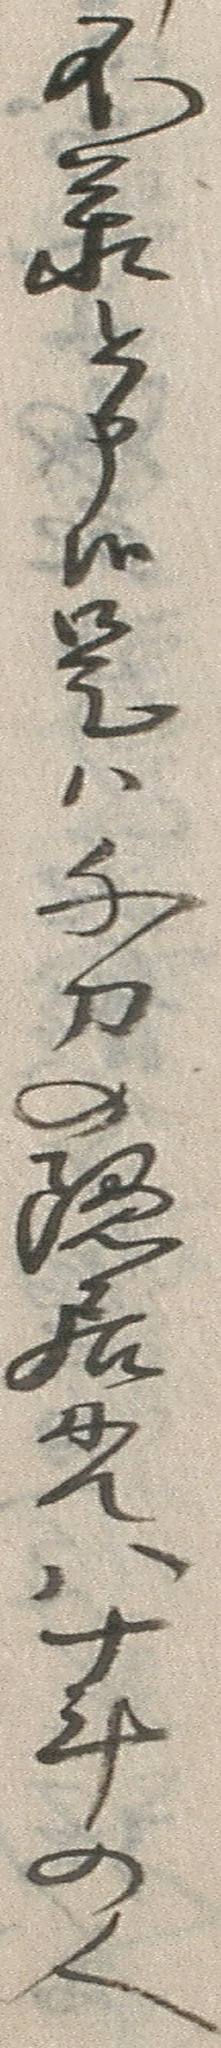不承と申候是は与力の隠居にて八十斗の人
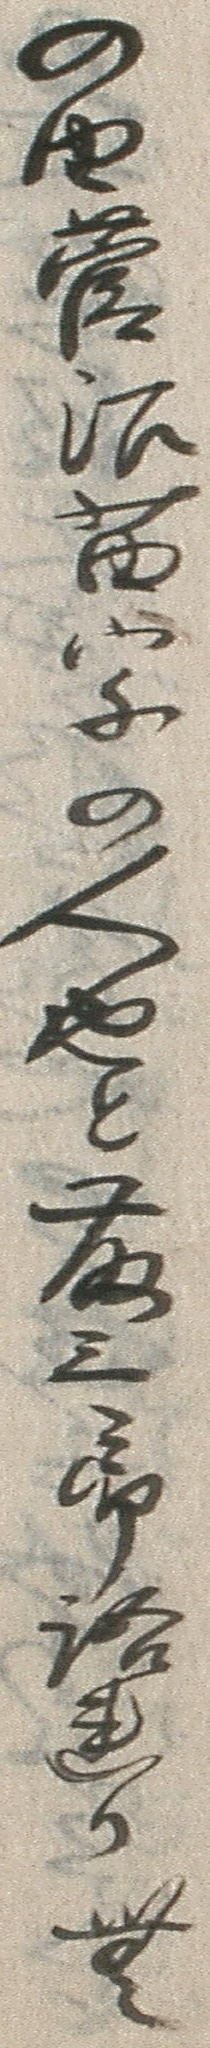の由菅沼苗字の人也と藤三郎語れり無
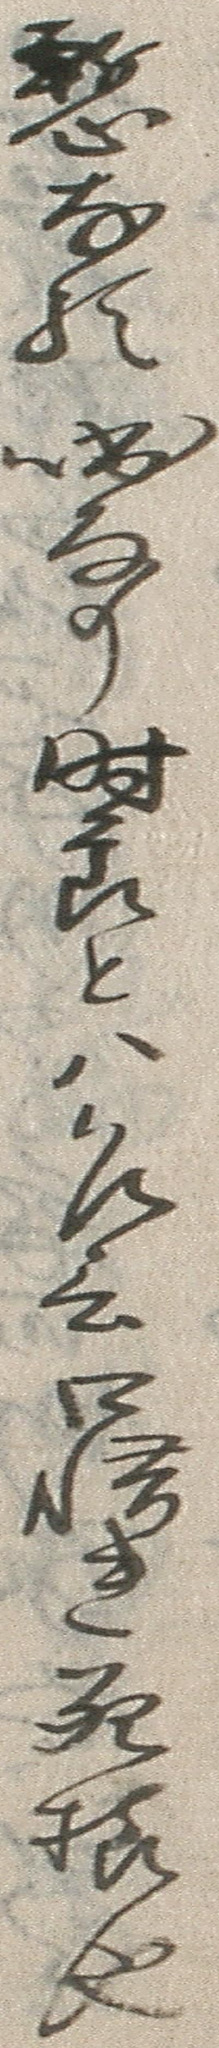慙なる咄なり時節とは乍言口惜き死様也
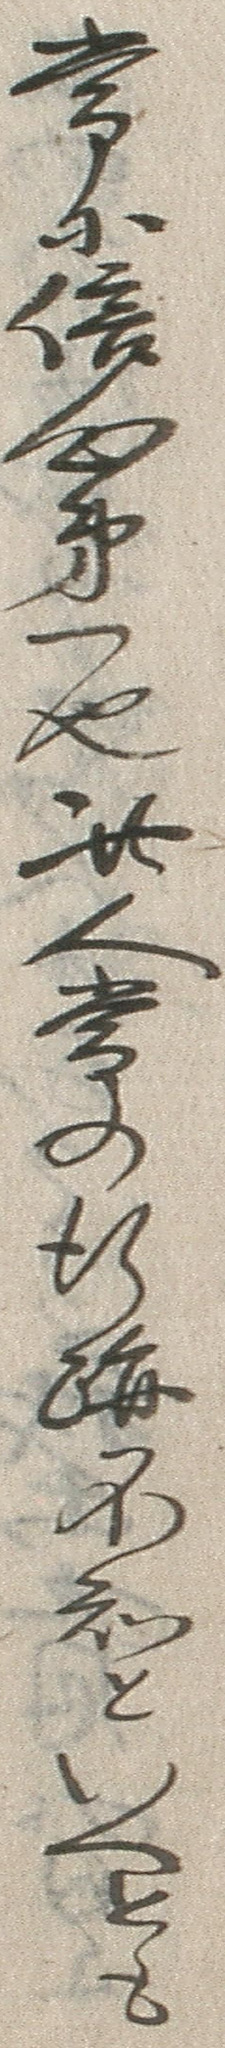常に信心第一也此人常の行跡不知といへとも
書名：享保十三年江戸洪水記
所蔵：東京大学地震研究所図書室 Earthquake Research Institute Library, The University of Tokyo, JAPAN
